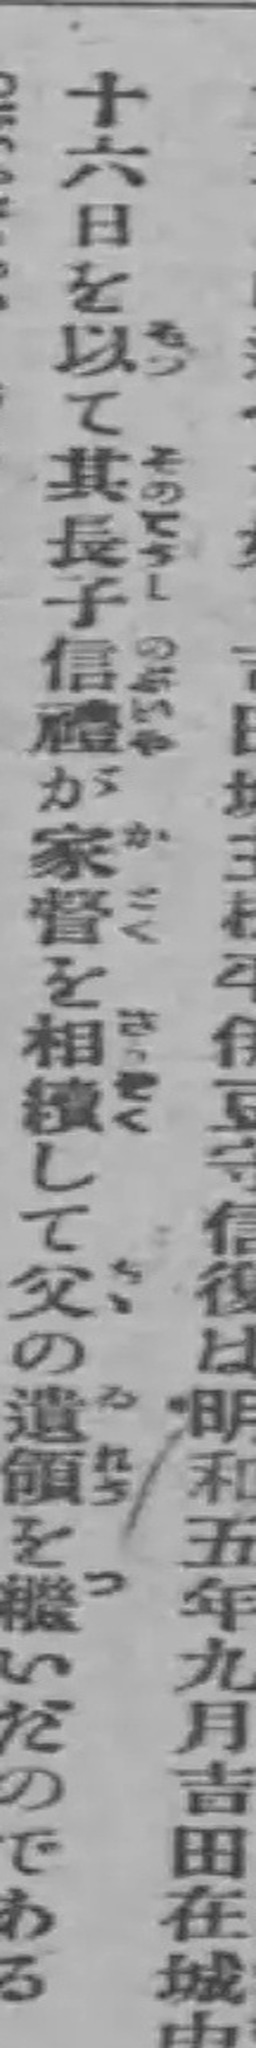十六日を以て其長子信礼が家督を相続して父の遺領を継いだのである
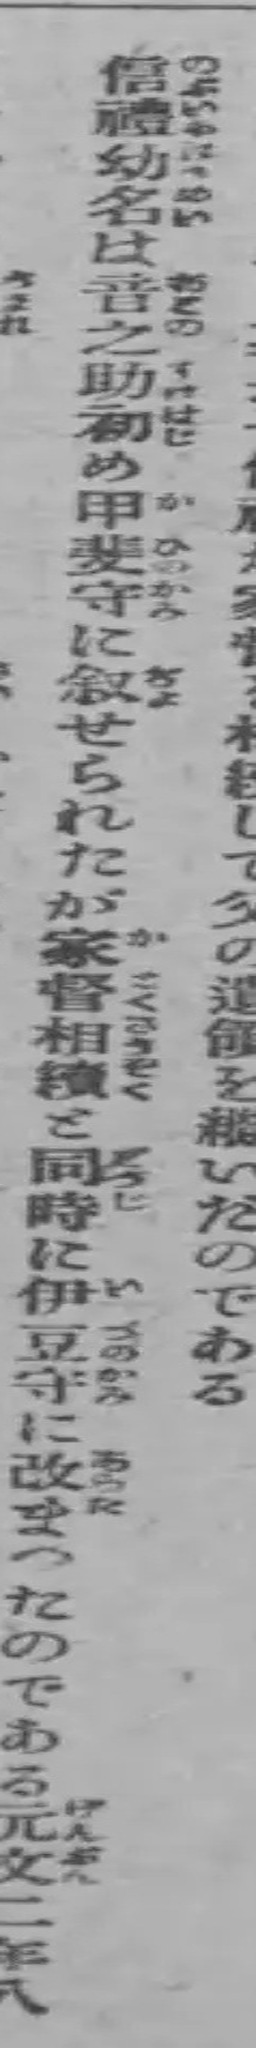信礼幼名は音之助初め甲斐守に叙せられたが家督相続と同時に伊豆守に改まつたのである元文二年八
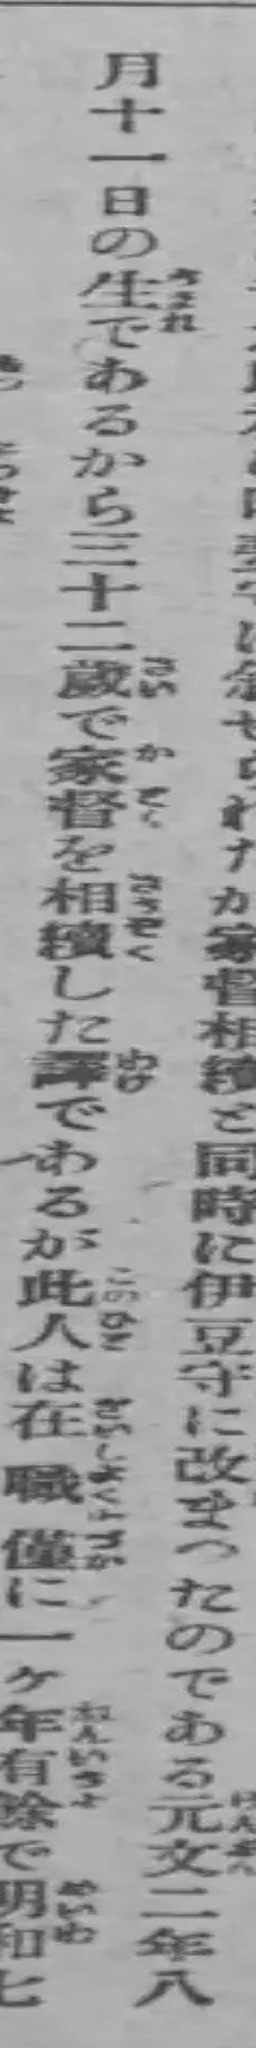月十一日の生であるから三十二歳で家督を相続した訳であるが此人は在職僅に一ケ年有余で明和七
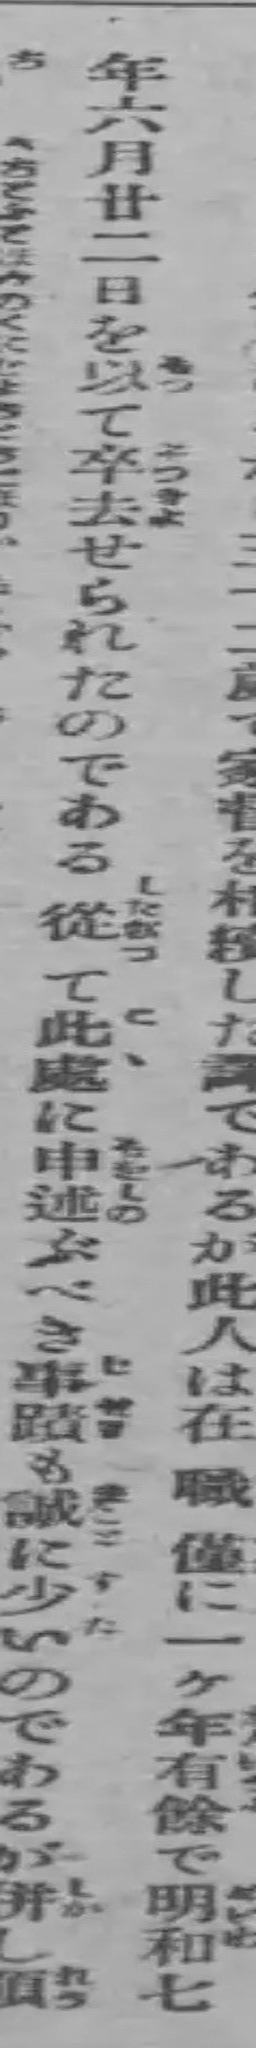年六月廿二日を以て卒去せられたのである従て此処に申述ぶべき事蹟も誠に少いのであるが併し領
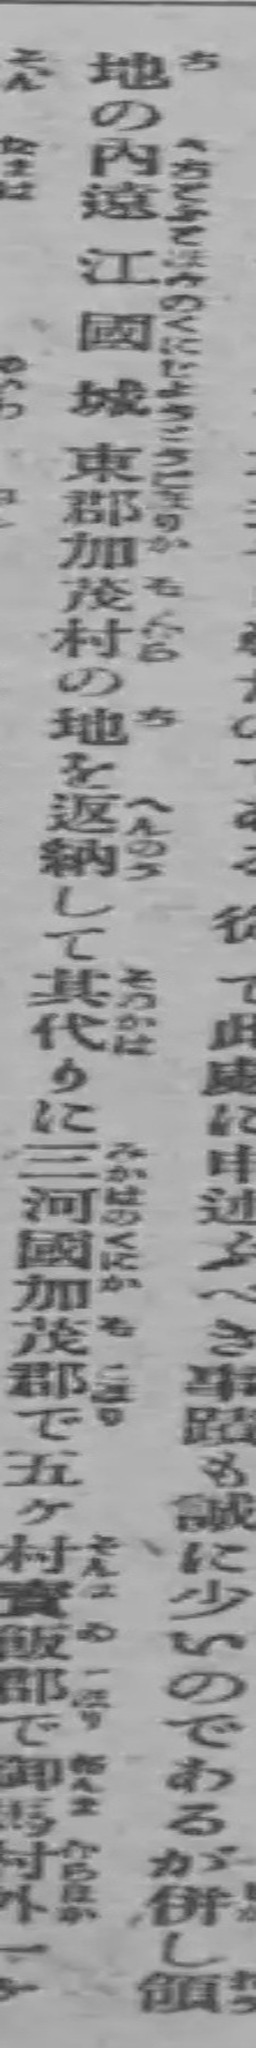地の内遠江国城東郡加茂村の地を返納して其代りに三河国加茂郡で五ケ村宝飯郡で御馬村外一ケ
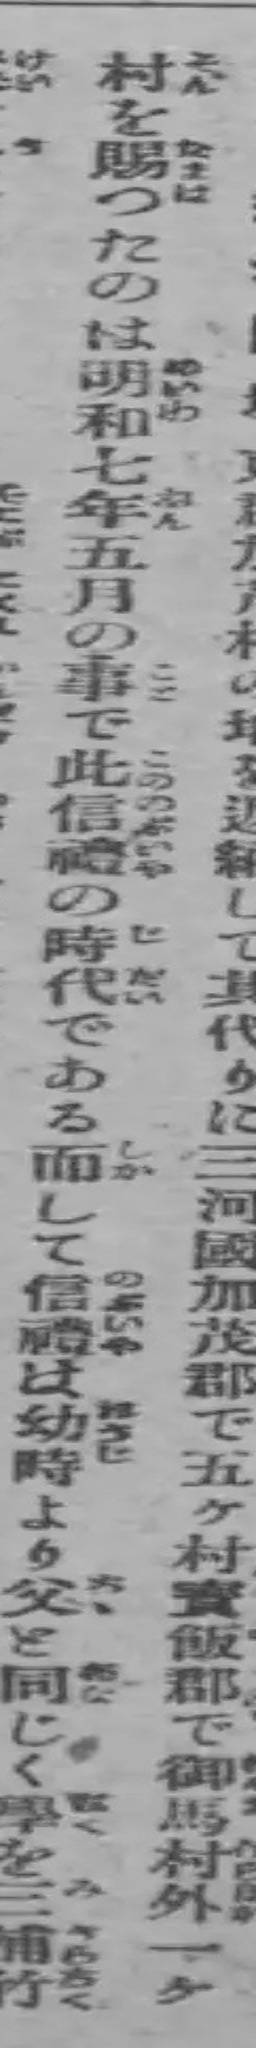村を賜つたのは明和七年五月の事で此信礼の時代である而して信礼は幼時より父と同じく学を三浦竹
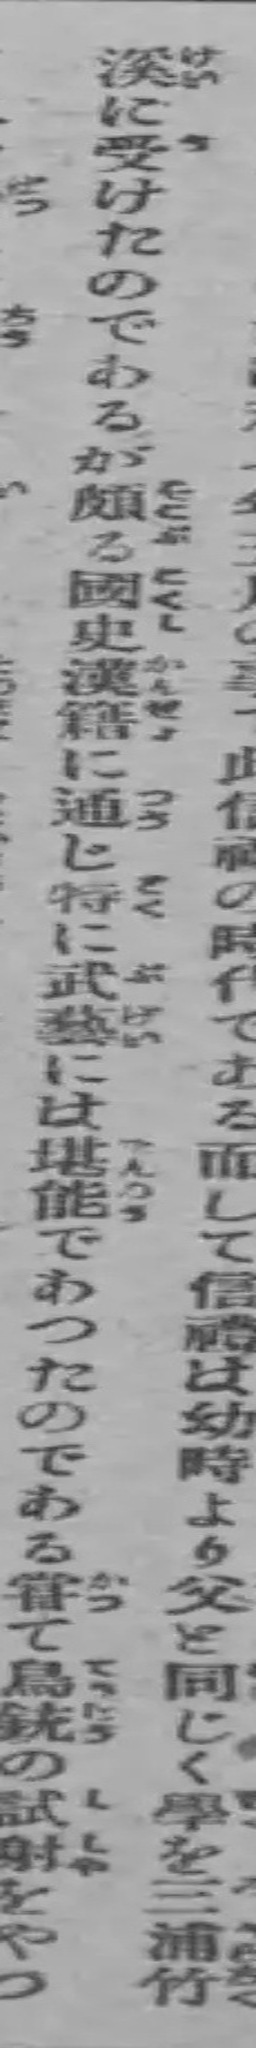渓に受けたのであるが頗る国史漢籍に通じ特に武芸には堪能であつたのである嘗て鳥銃の試射をやつ
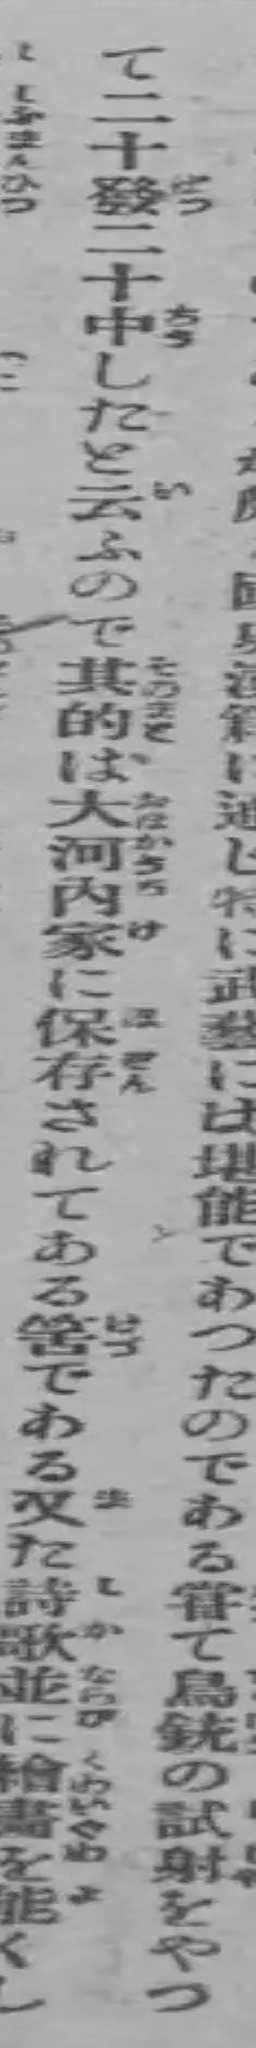て二十発二十中したと云ふので其的は大河内家に保存されてある筈である又た詩歌並に絵画を能くし
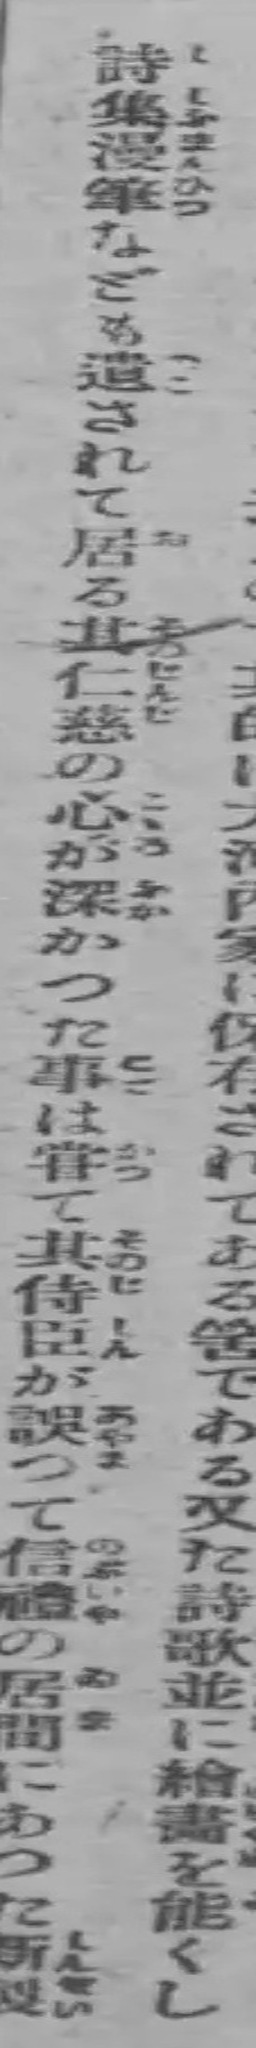詩集漫筆なども遺されて居る其仁慈の心が深かつた事は嘗て其侍臣が誤つて信礼の居間にあつた新製
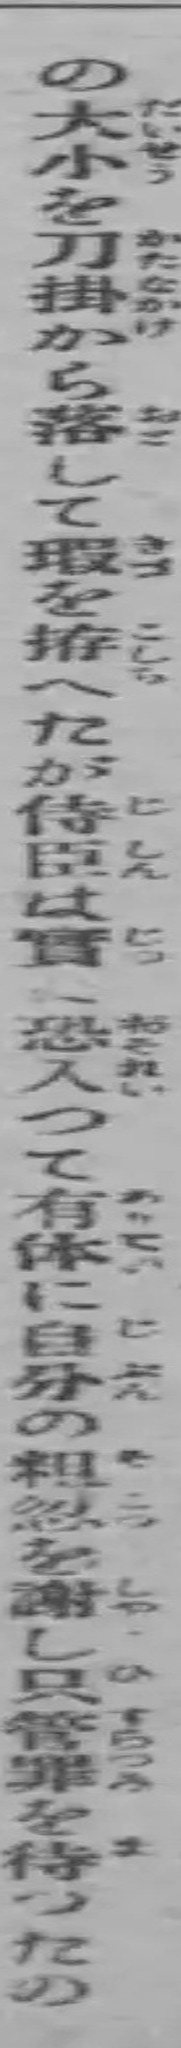の大小を刀掛から落して瑕を拵へたが侍臣は実に恐入つて有体に自分の粗忽を謝し只管罪を待つたの
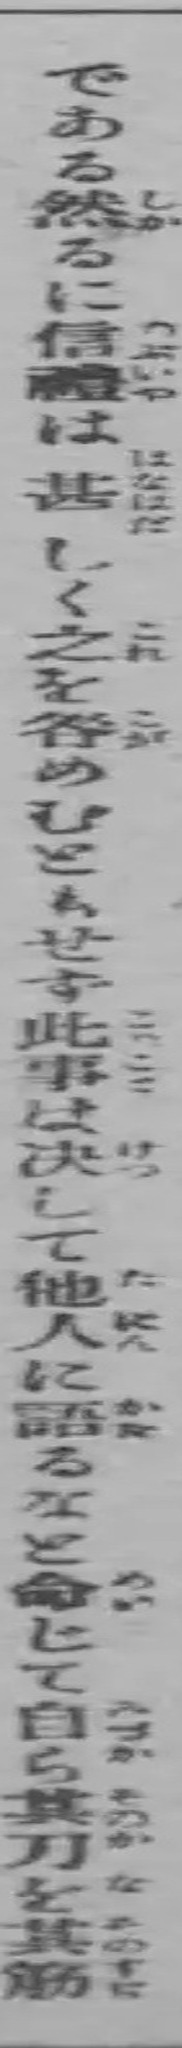である然るに信礼は甚しく之を咎めむともせず此事は決して他人に語るなと命じて自ら其刀を其筋
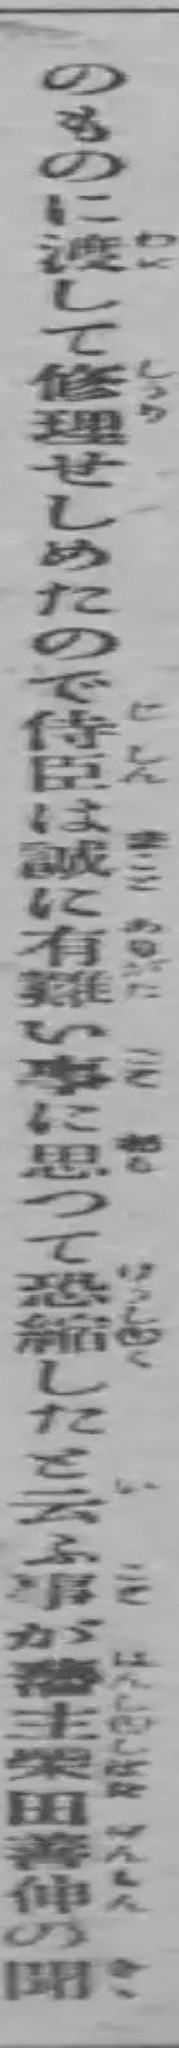のものに渡して修理せしめたので侍臣は誠に有難い事に思つて恐縮したと云ふ事が藩主柴田善伸の聞
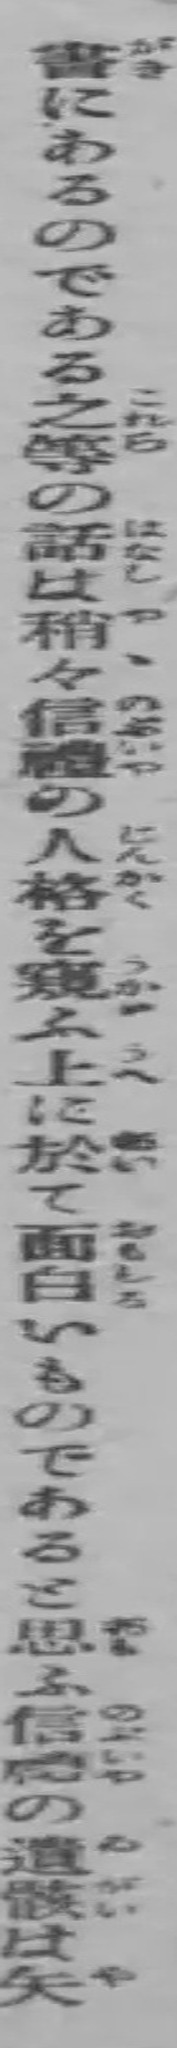書にあるのである之等の話は稍々信礼の人格を窺ふ上に於て面白いものであると思ふ信礼の遺骸は矢
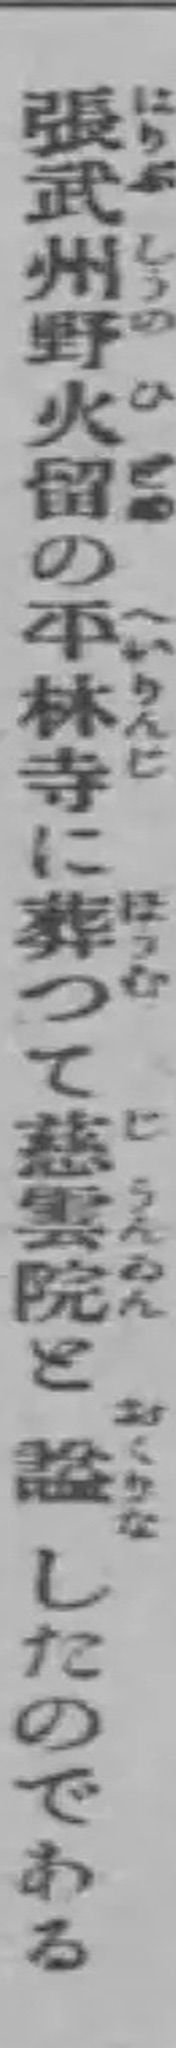張武州野火留の平林寺に葬つて慈雲院と諡したのである
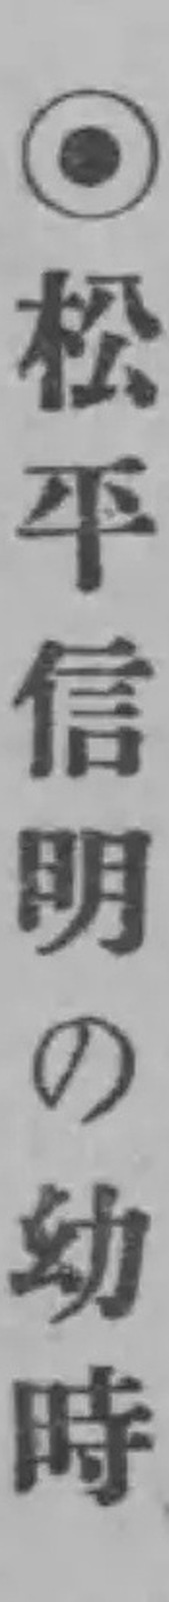⦿松平信明の幼時
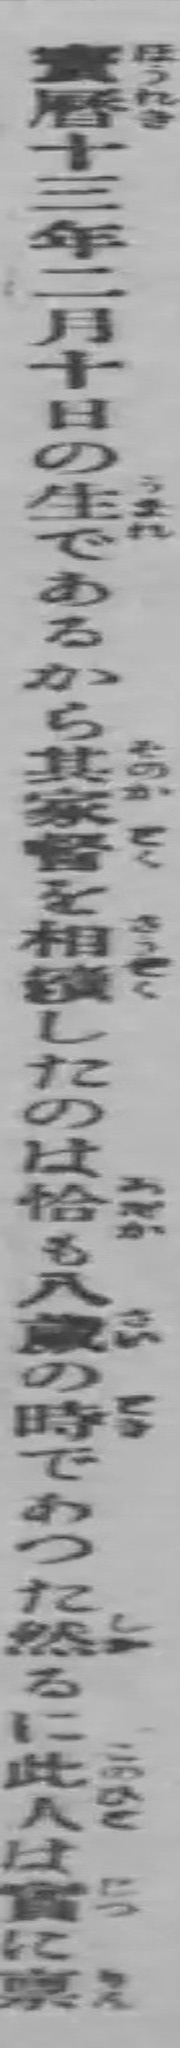宝暦十三年二月十日の生であるから其家督を相続したのは恰も八歳の時であつた然るに此人は実に稟
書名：豊橋市史談
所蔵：国立国会図書館 National Diet Library, JAPAN
